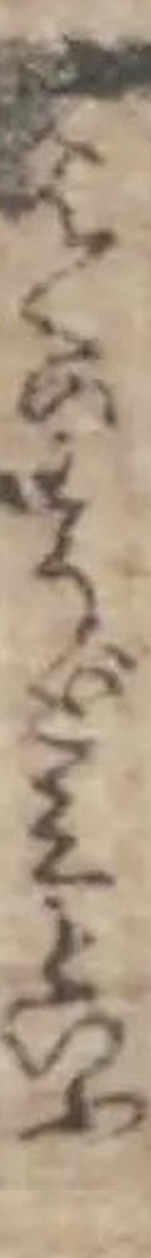はくりうどミといふ
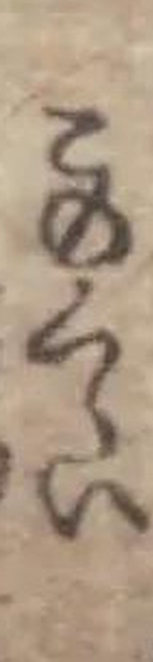このくらい
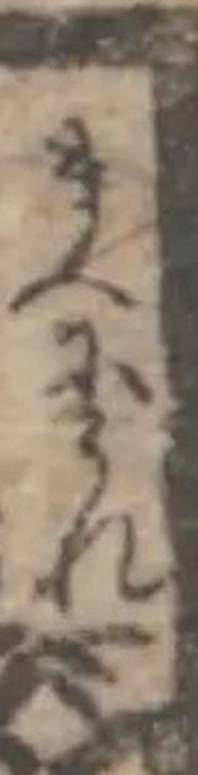まへにうれ
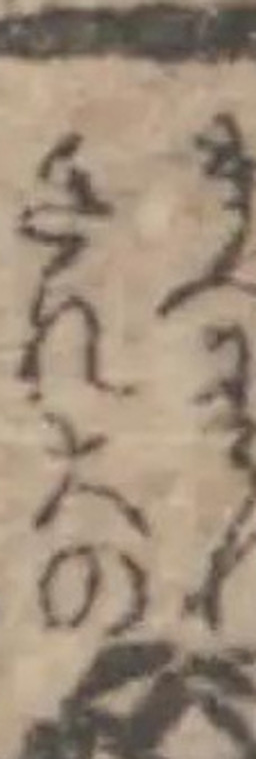きれ大の
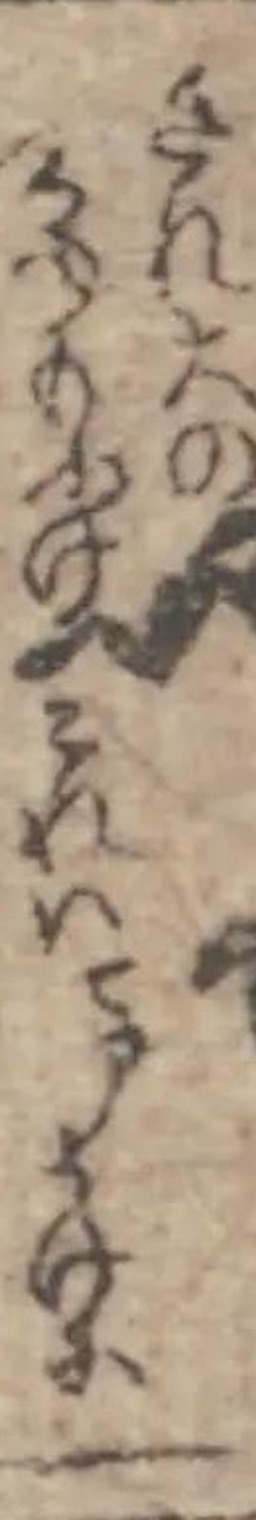かねもふけこれハマアうけに
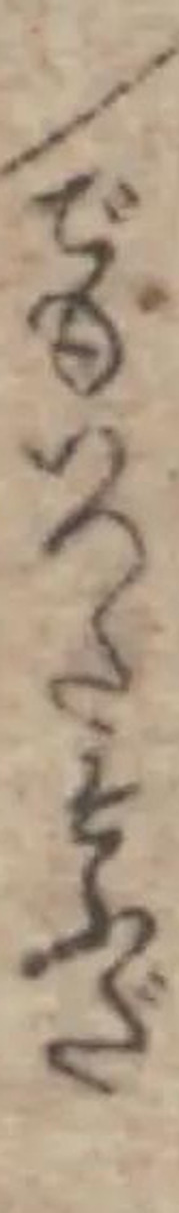でもいつたそふだ
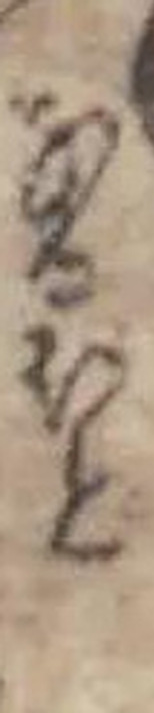なるほと
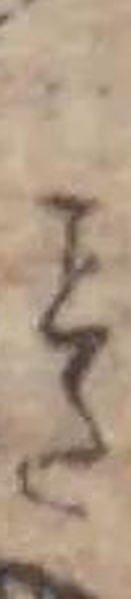ことだ
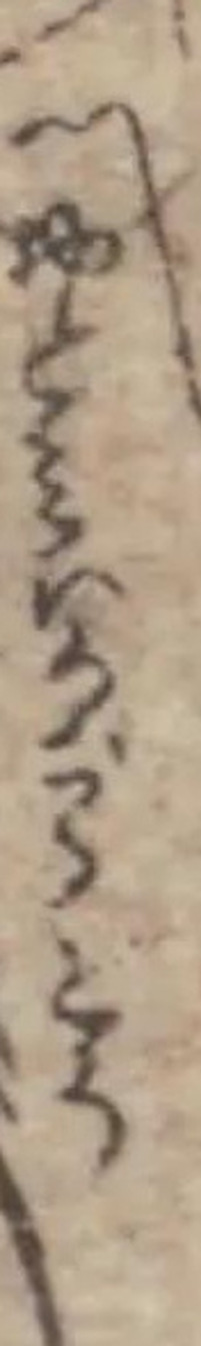「おとミハかぐらどう
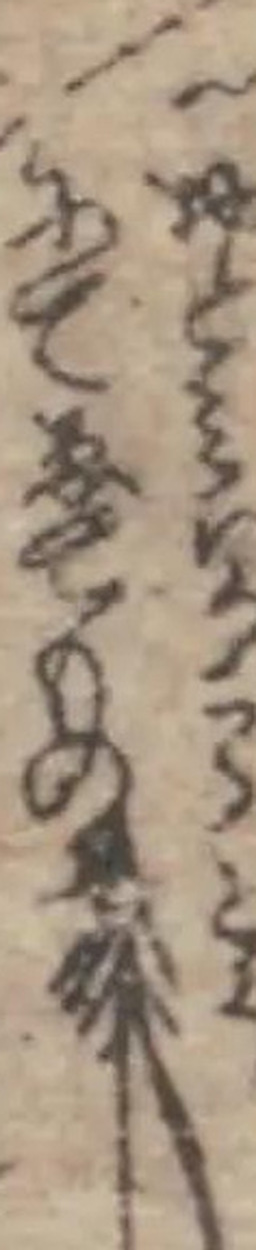にてゑての
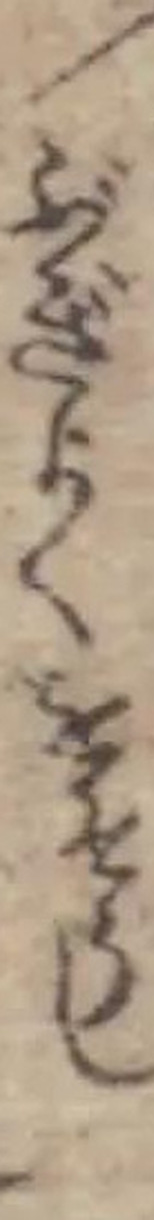ぶぎきょくをそうし
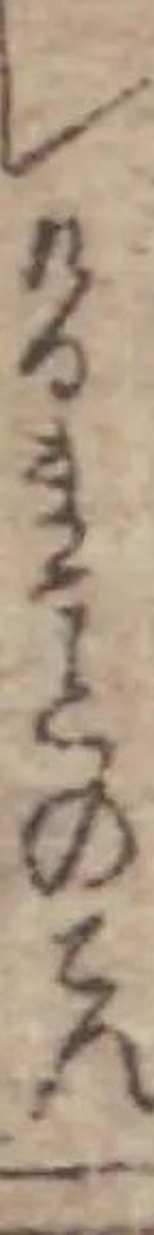けるまことのてん
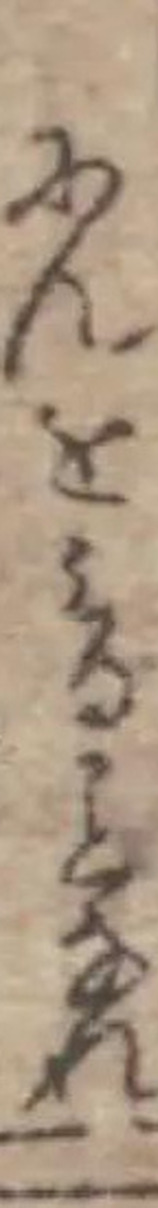にんをミることなれ
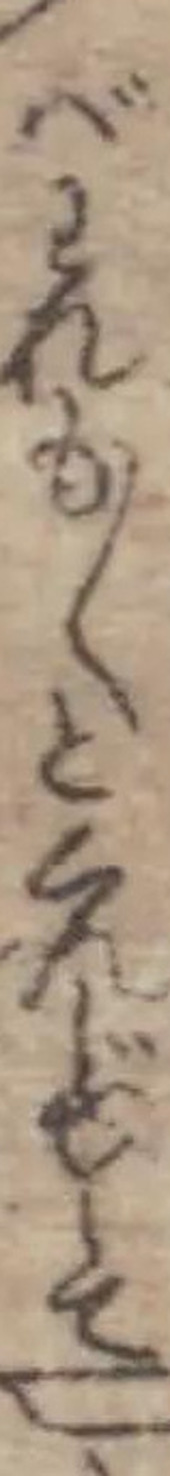バわれも〳〵とくんじゆして
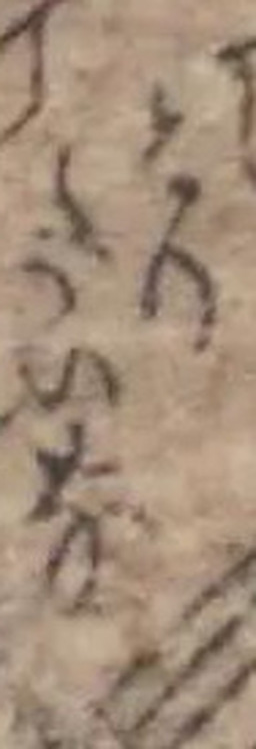たいな
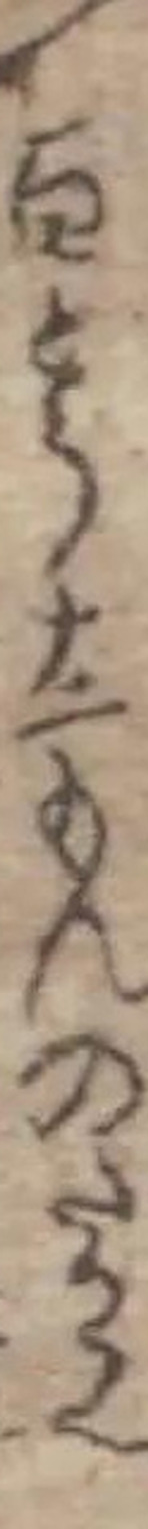百とう十二ものたから
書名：草紙の曙 3巻
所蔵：国立国会図書館 National Diet Library, JAPAN
